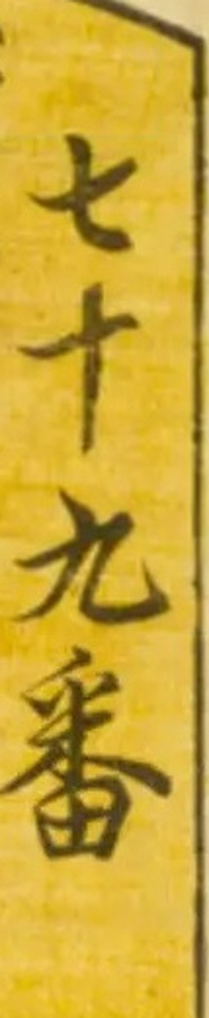七十九番
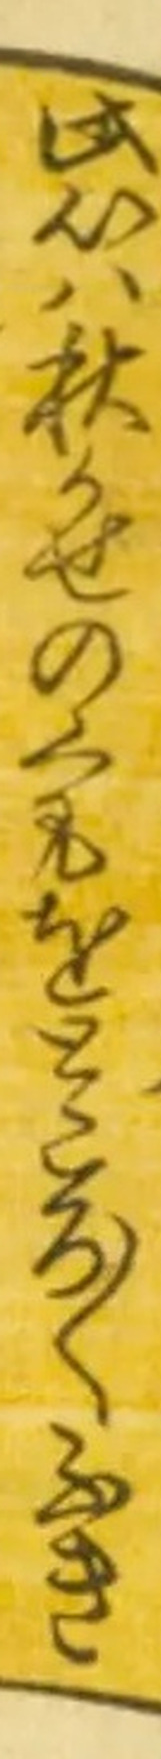此心は秋かせのくもをところ〳〵ふき
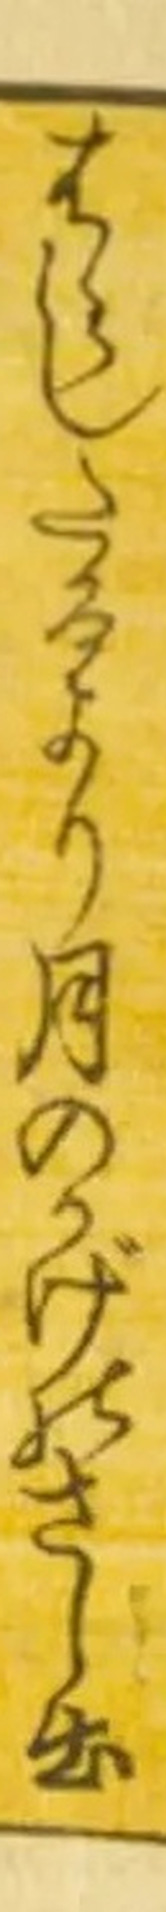はらしたるより月のかげのさし出
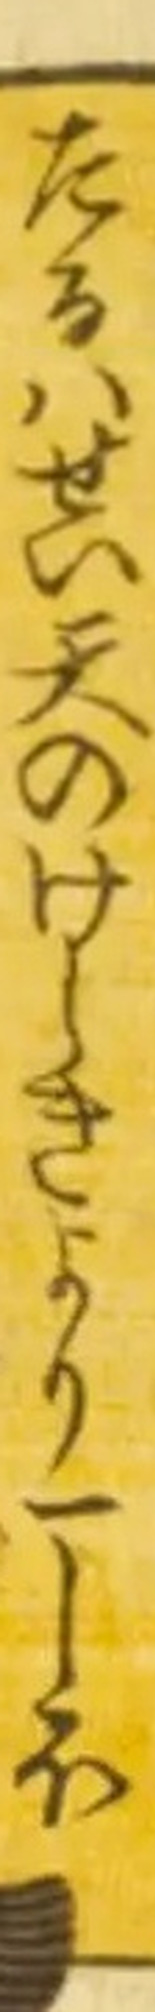たるはせい天のけしきより一しほ
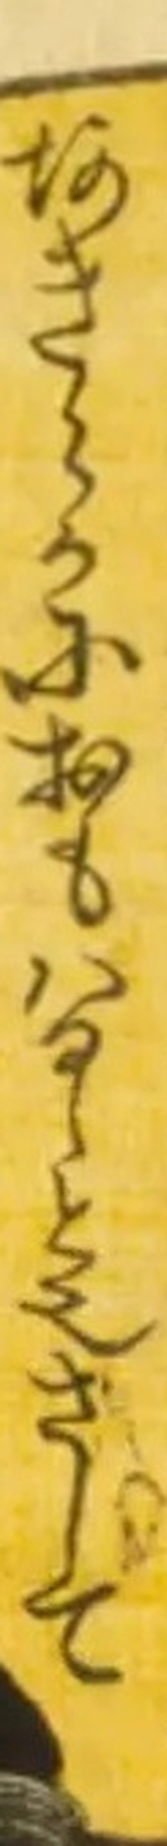あきらかにおもはるゝと也さして
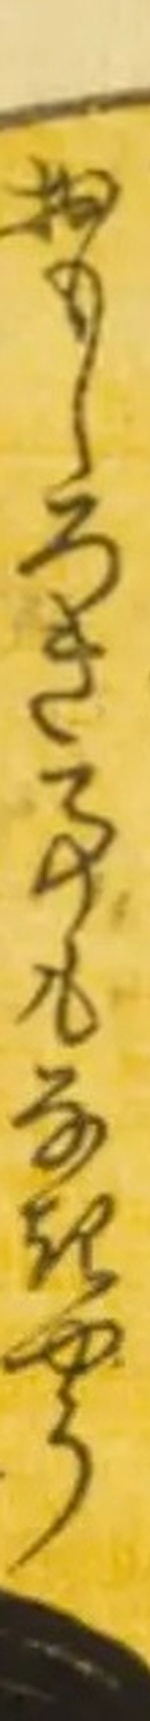おもしろき事もなきやう
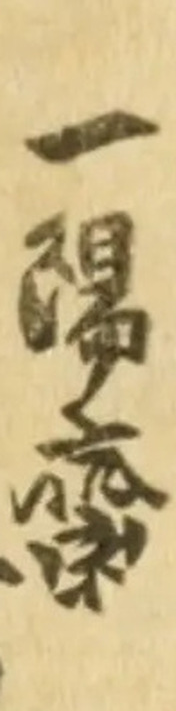一陽斎
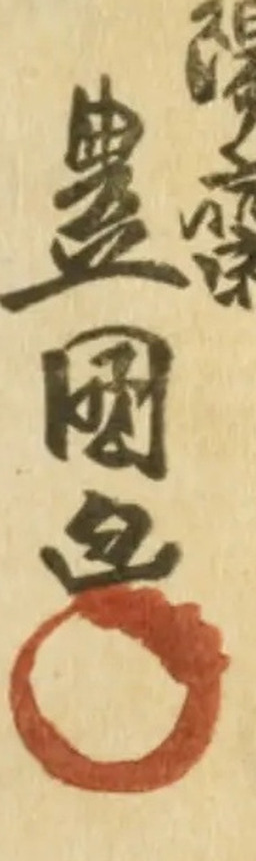豊国画
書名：七十九番　左京太夫顕輔
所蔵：国立国会図書館 National Diet Library, JAPAN
